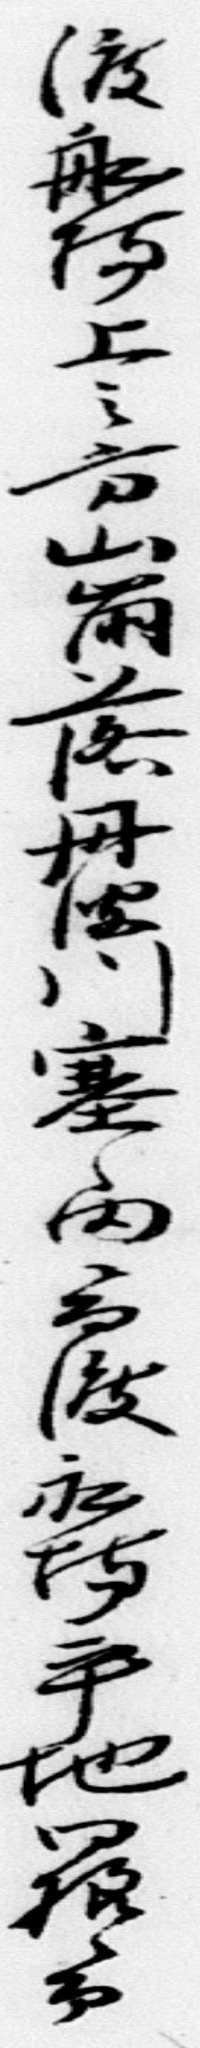渡船場上之方山崩落丹波川塞候由に而渡船場平地同様に而
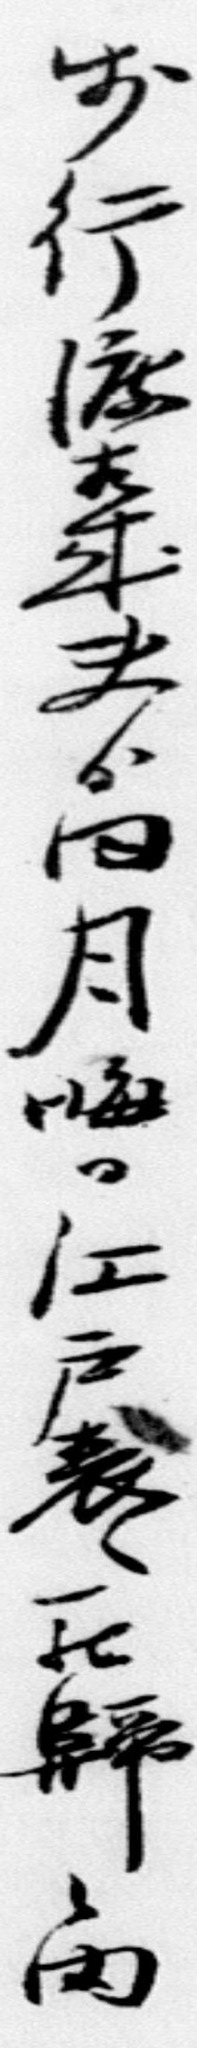歩行渡相成夫ゟ四月晦日江戸表へ罷帰候由
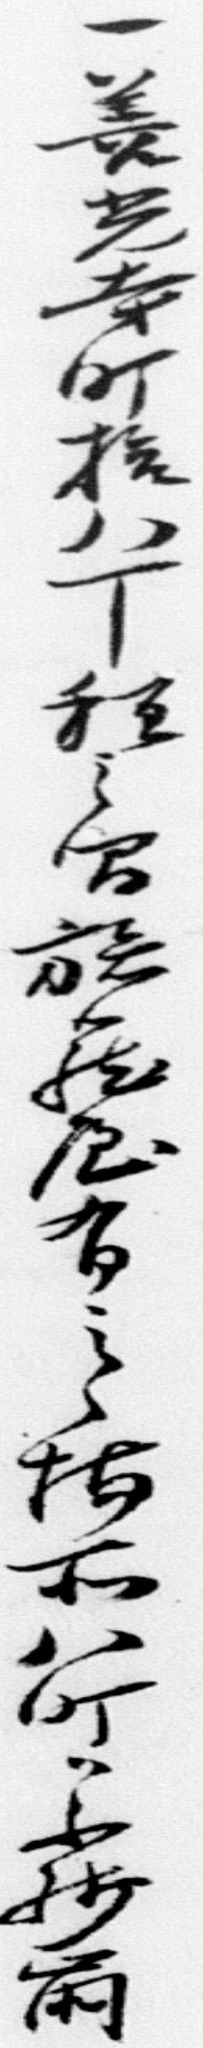一善光寺町拾八丁程之間旅籠屋有之候場所八町は不残崩
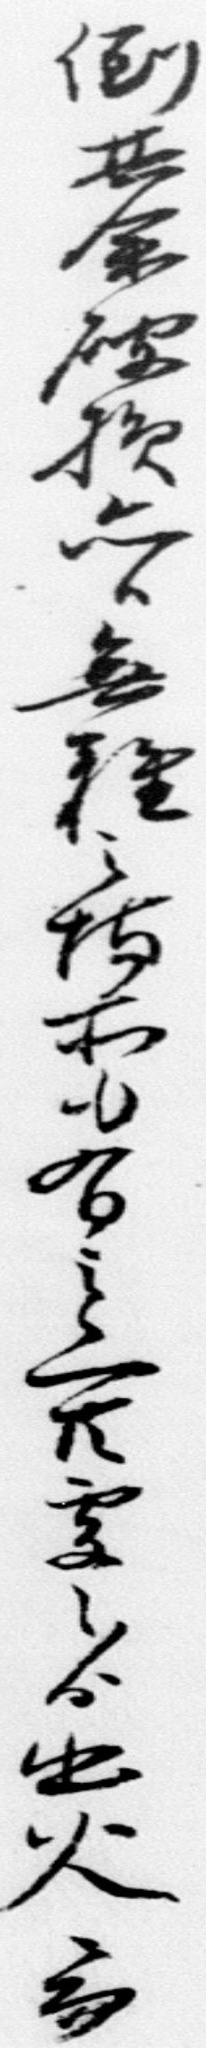倒其余破損亦は無難之場所も有之候へ共処々ゟ出火に而
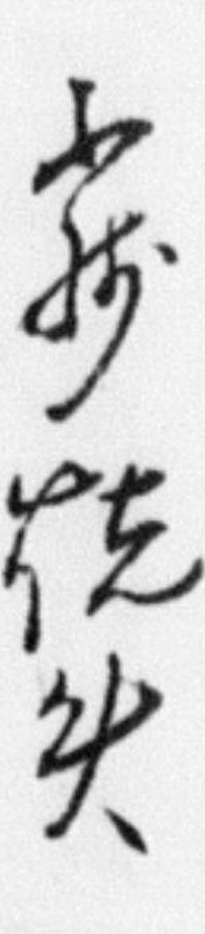不残焼失
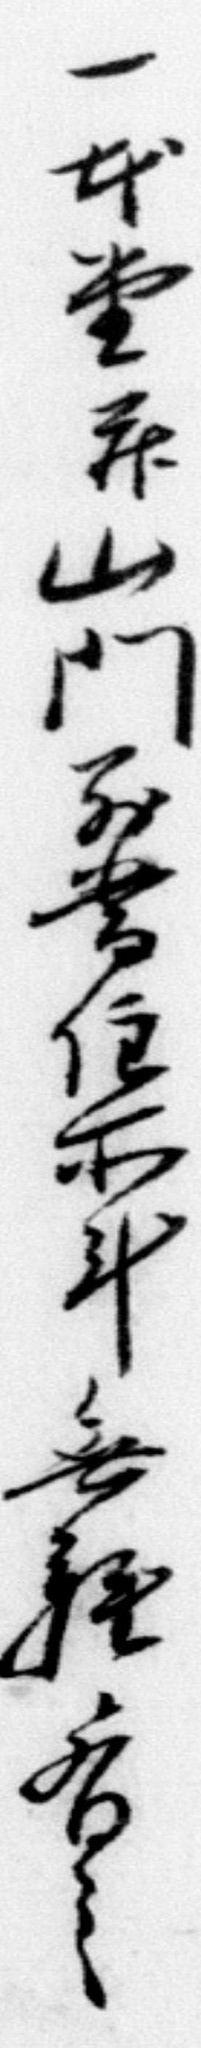一本堂幷山門別当住所計無難に有之
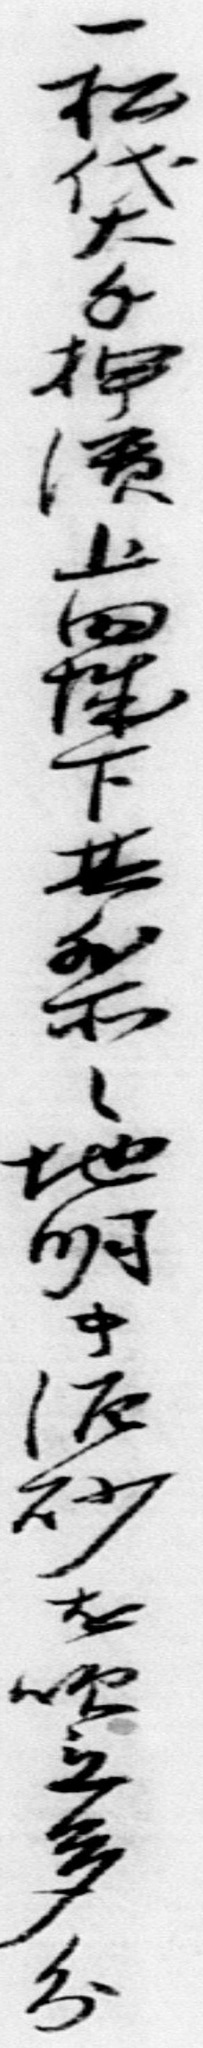一松代大手押潰上田城下其外所々地明き泥砂を吹立多分
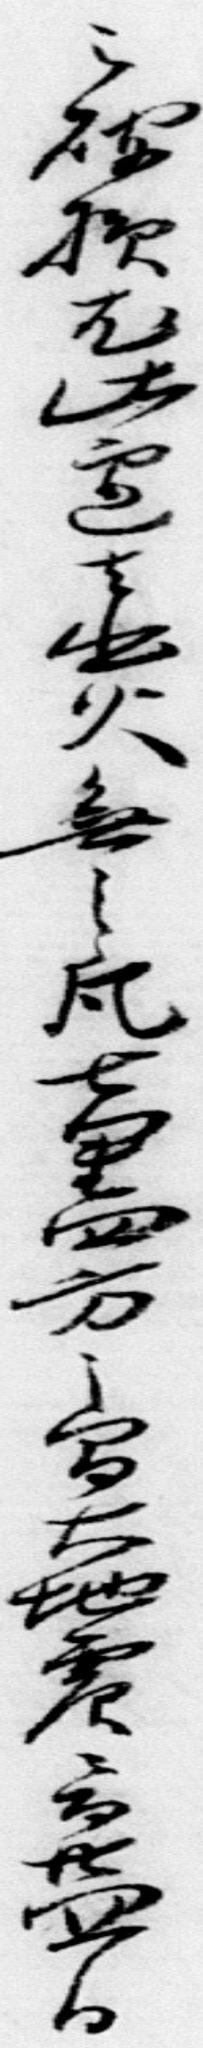之破損尤此辺は出火無之凡七里四方之間大地震に而廿四日
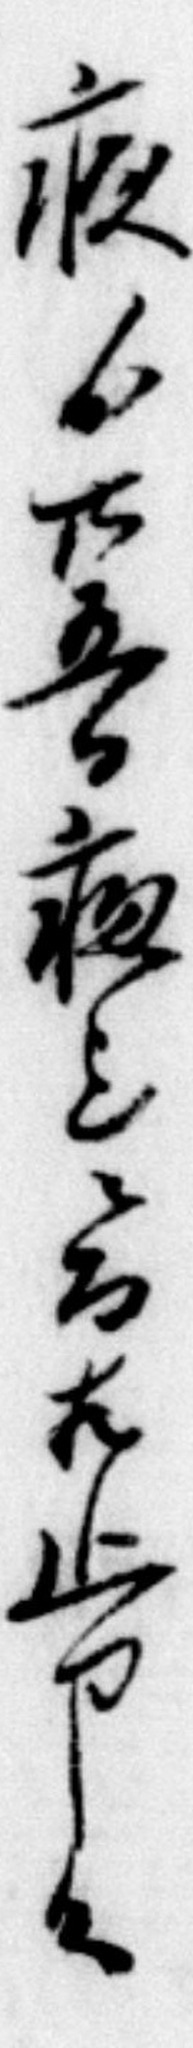夜ゟ廿五日夜迄に而相止申候

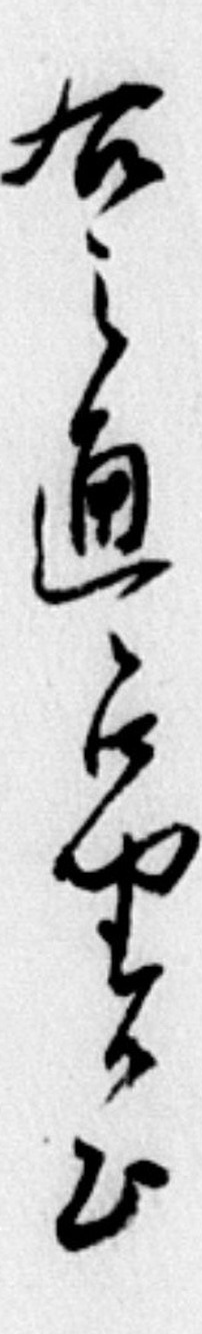右之通に御座候以上
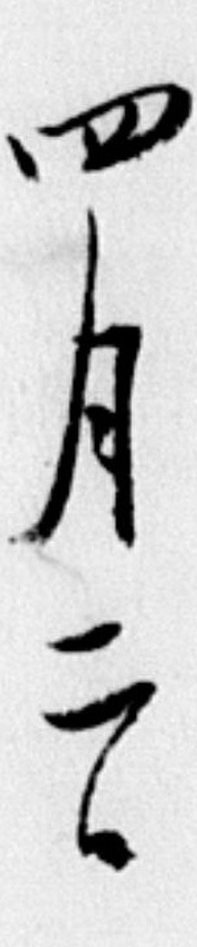四月二日
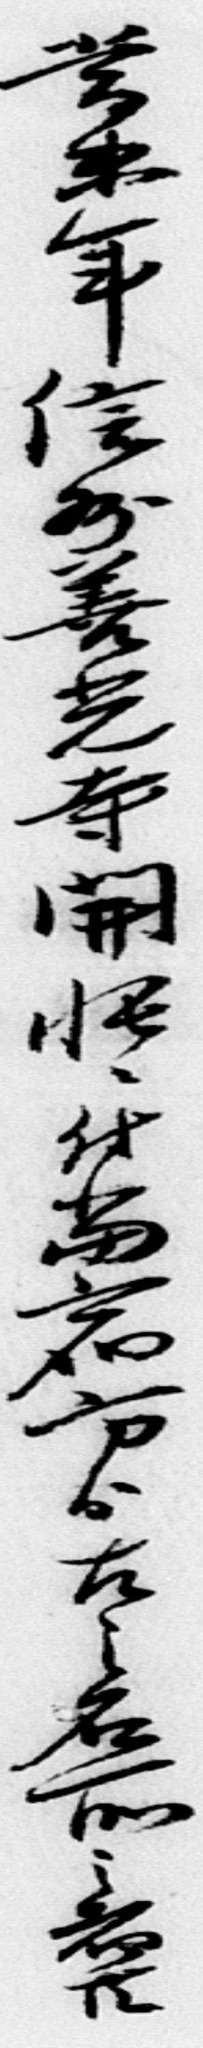当未年信州善光寺開帳に付当宿方ゟ左之名前之者共
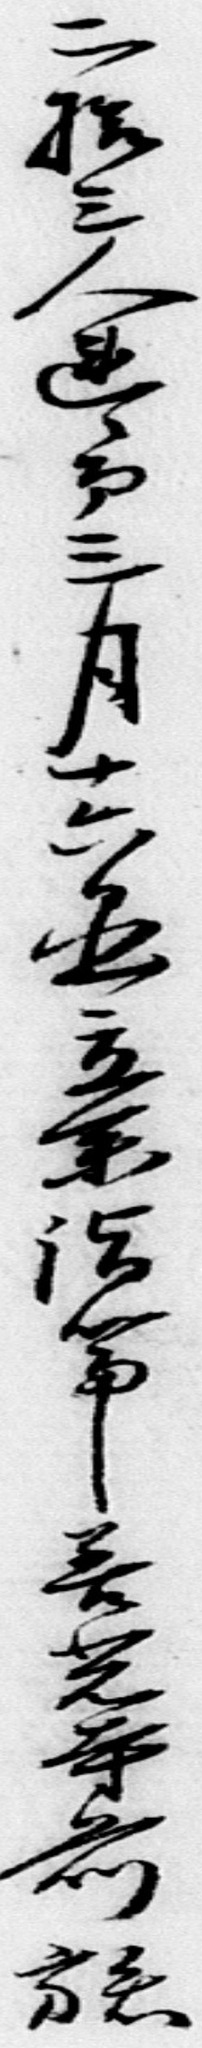二拾三人連に而三月十六日出立参詣いたし善光寺前旅
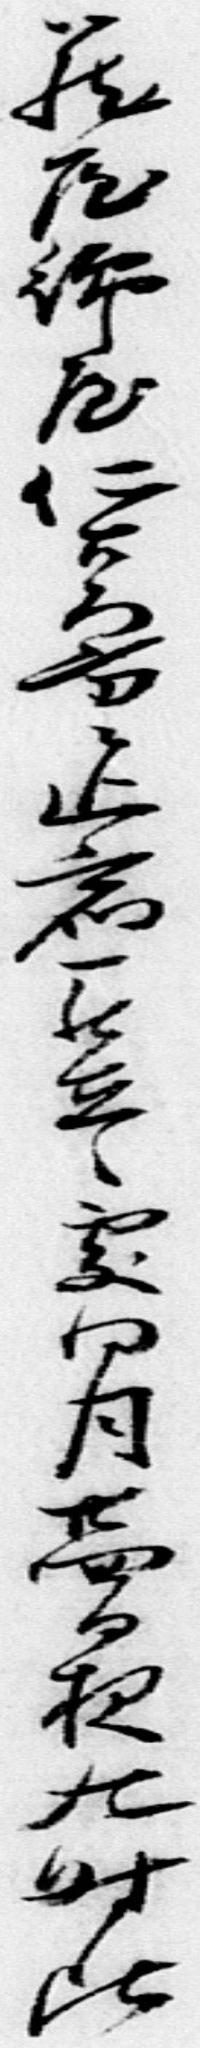籠屋綿屋仁左衛門方に止宿罷在候処四月廿四日夜九時頃
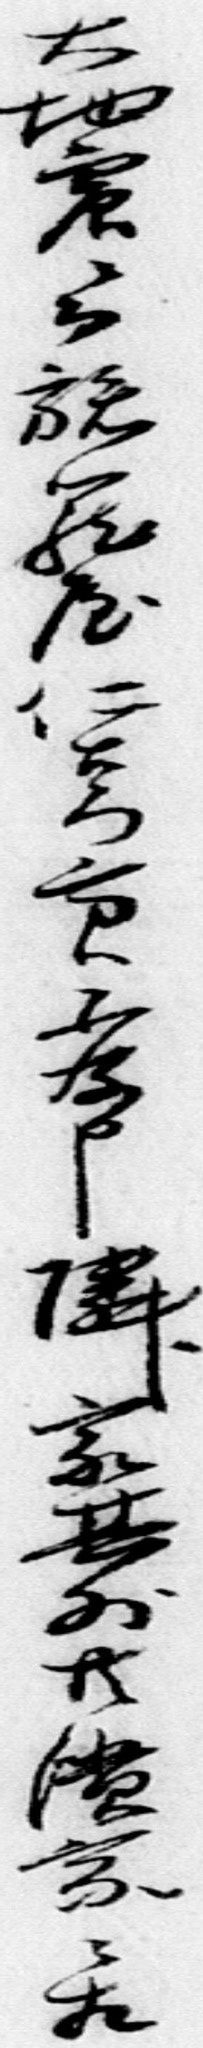大地震に而旅籠屋仁左衛門方は不及申隣家其外共潰家に相
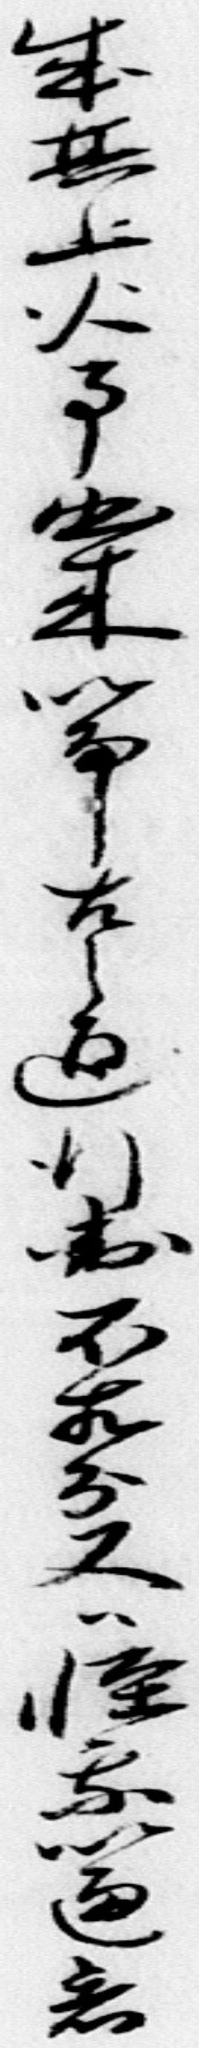成其上火事出来いたし左之通行衛不相分又は怪我いたし候者
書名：信州大地震一件
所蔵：徳島県立図書館
